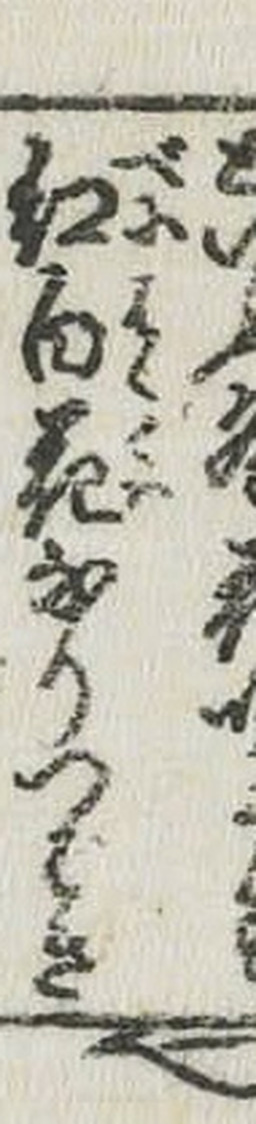紅白花なりつばき
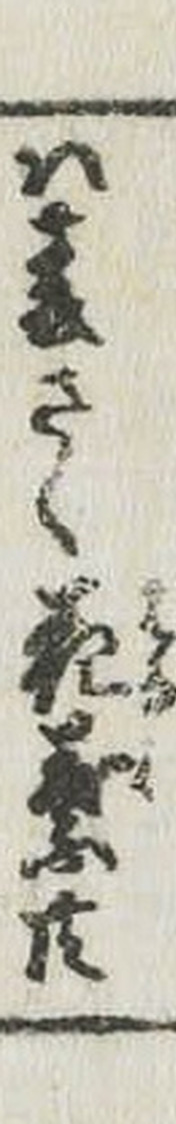は春さく花葉共
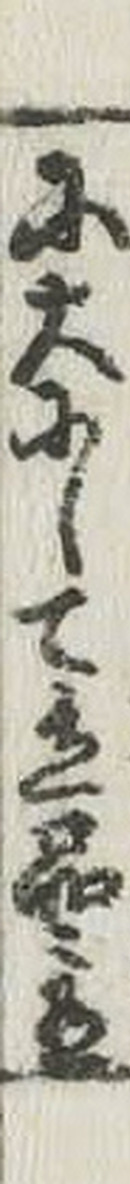に大にして色品有
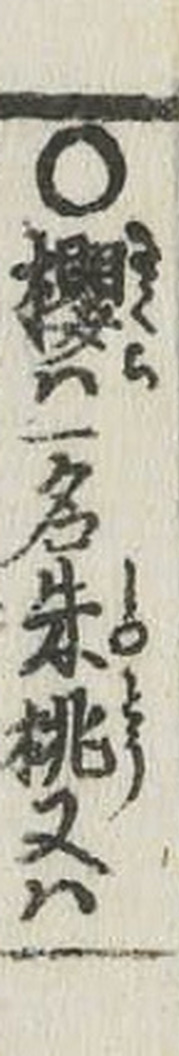○桜は一名朱桃又は
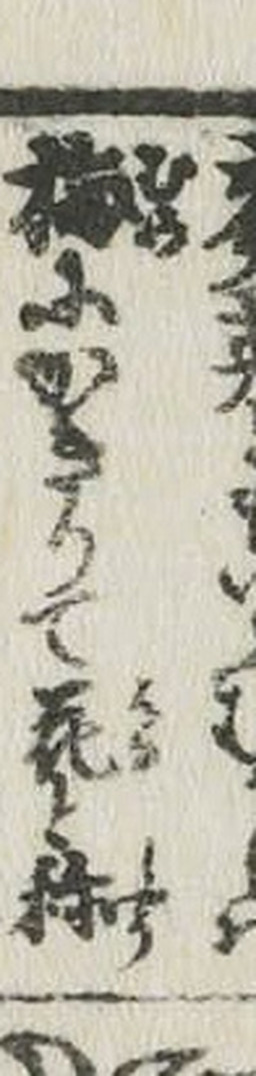梅にかきりて花と称
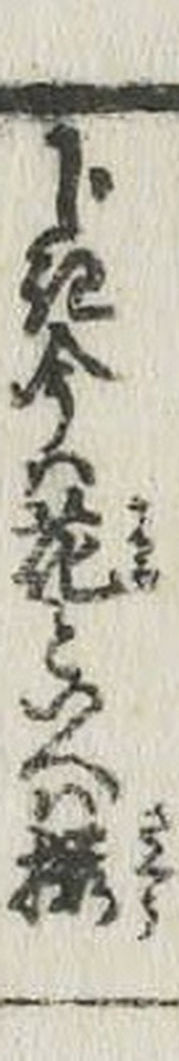じき今は花といへは桜
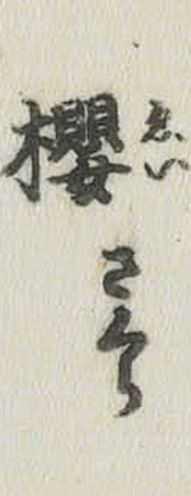桜さくら
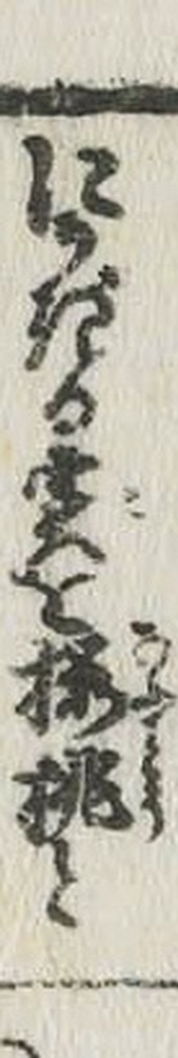にかぎる実を桜桃と
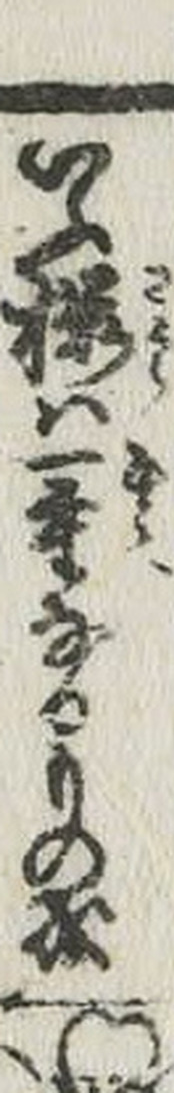いふ桜は一重なるもの成
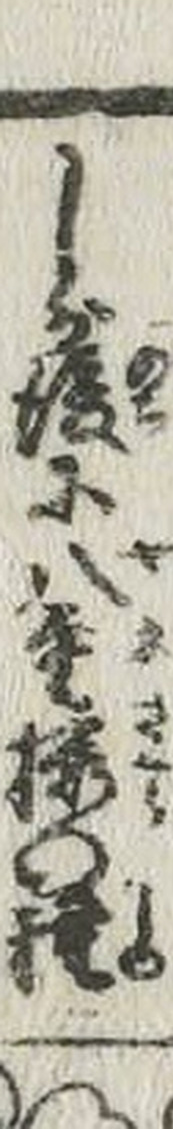しが後に八重桜の種
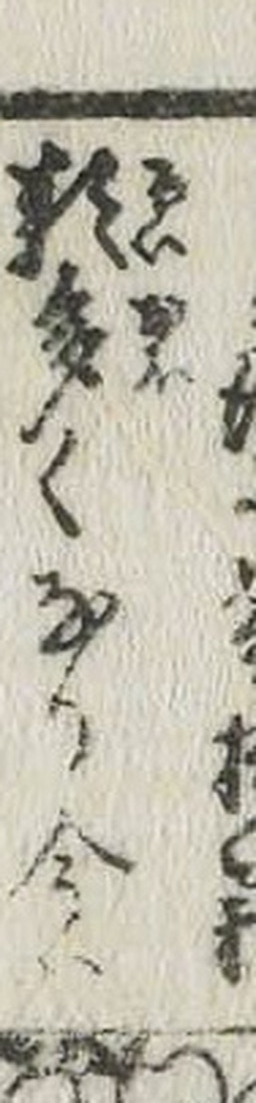類多くなり今は
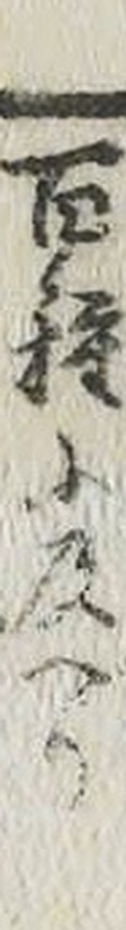百種に及べり
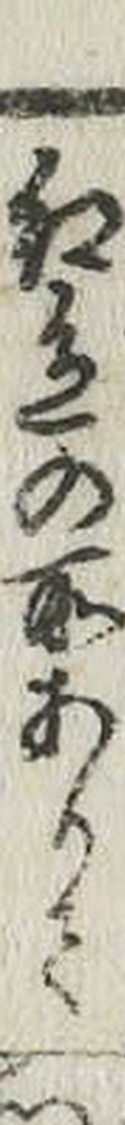紅色の所ありて
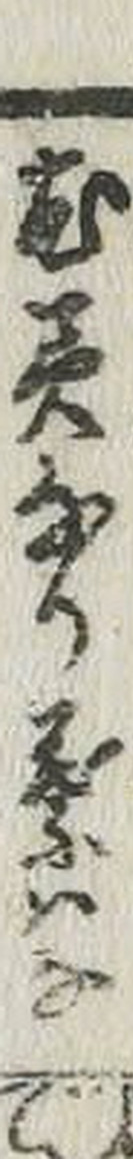尤美なり葉はな
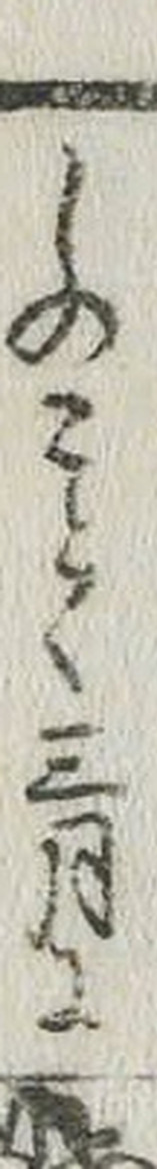しのことく三月に
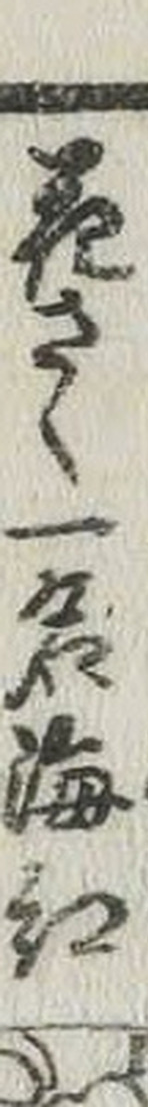花さく一名海紅
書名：増補頭書訓蒙図彙大成 10巻 8:巻之17-19
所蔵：東京学芸大学教育コンテンツアーカイブ
